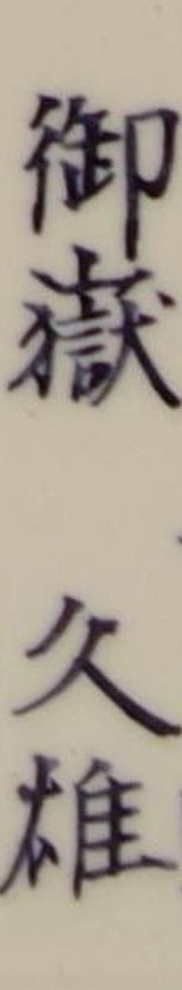御嶽久雄
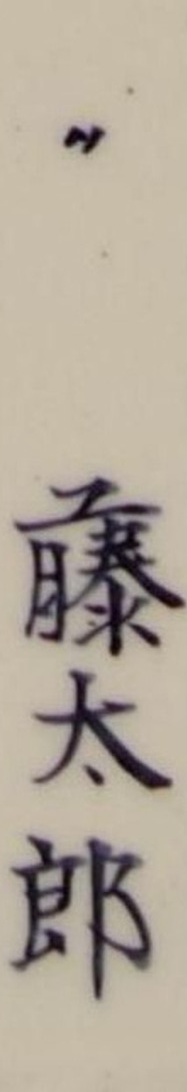藤太郎
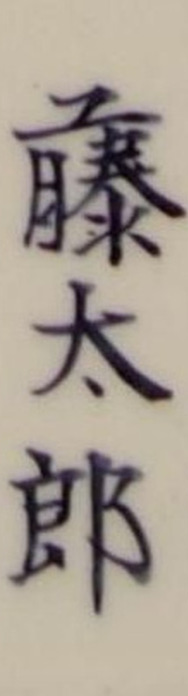藤太郎
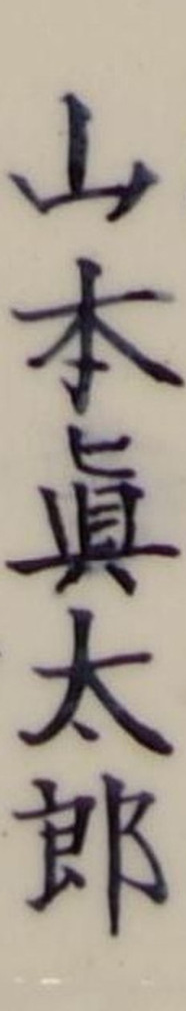山本真太郎
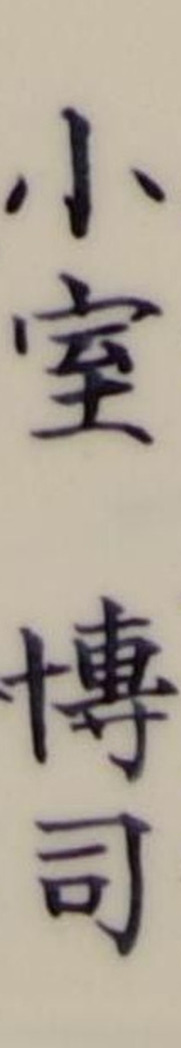小室博司
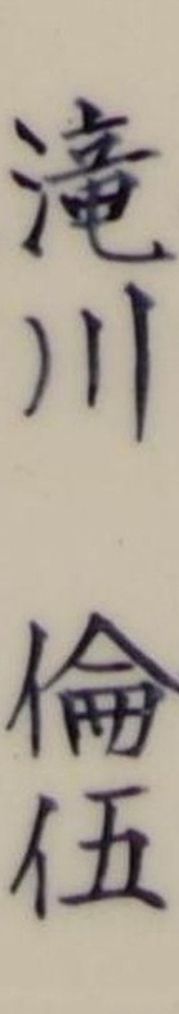滝川倫伍
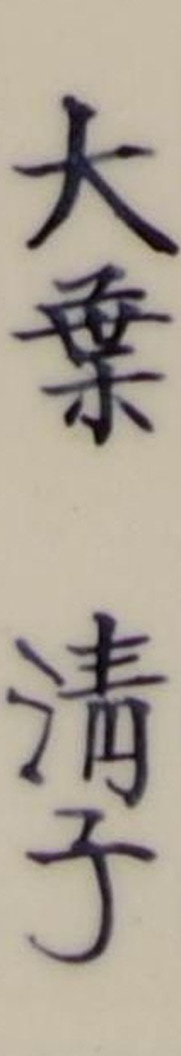大葉清子
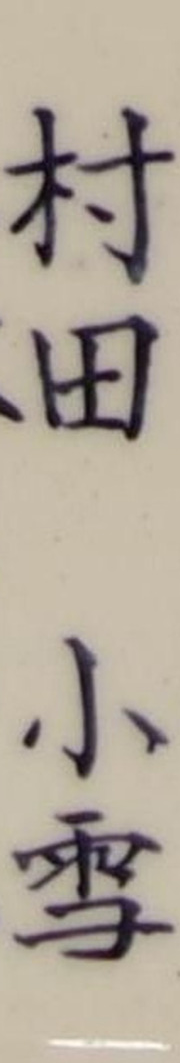村田小雪
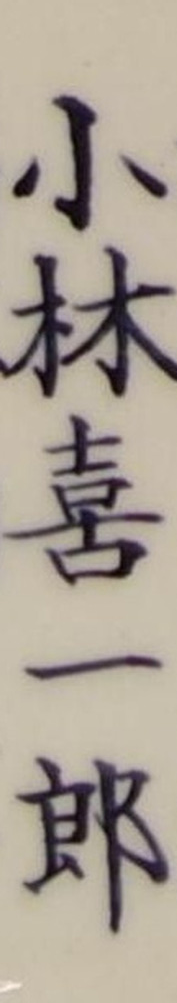小林喜一郎
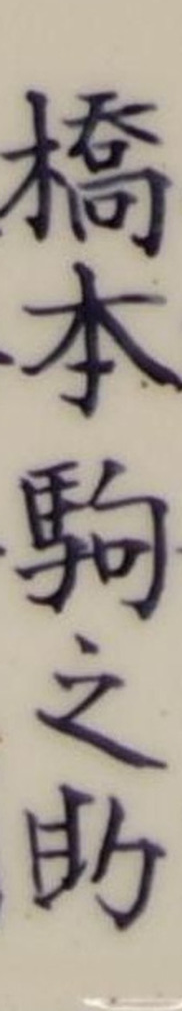橋本駒之助
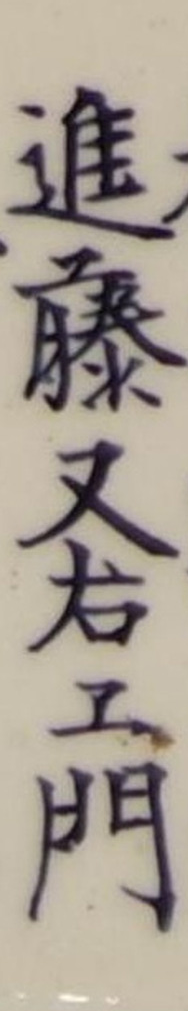進藤又右エ門
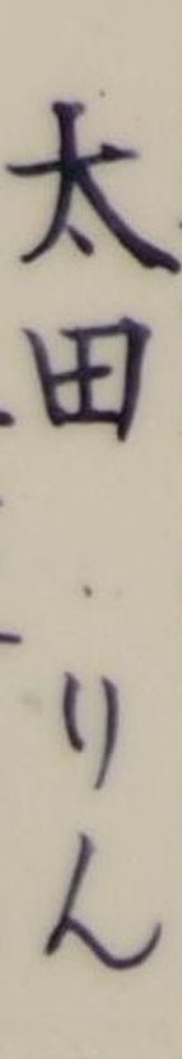太田りん
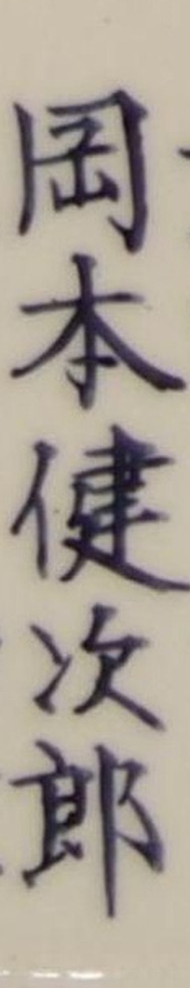岡本健次郎
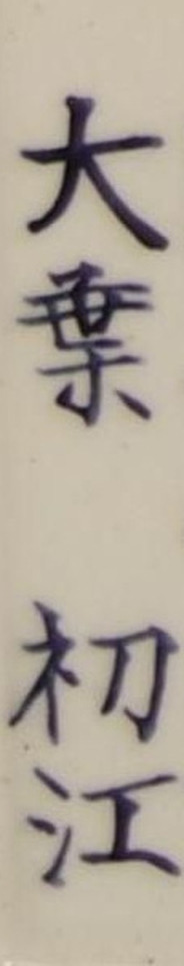大葉初江

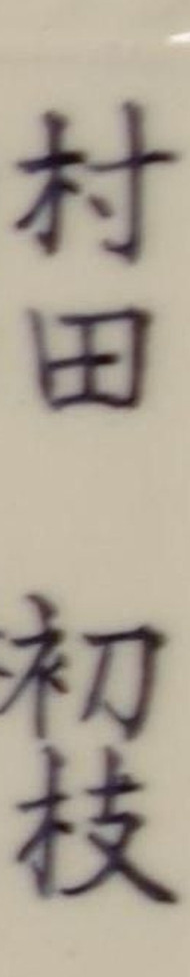村田初枝
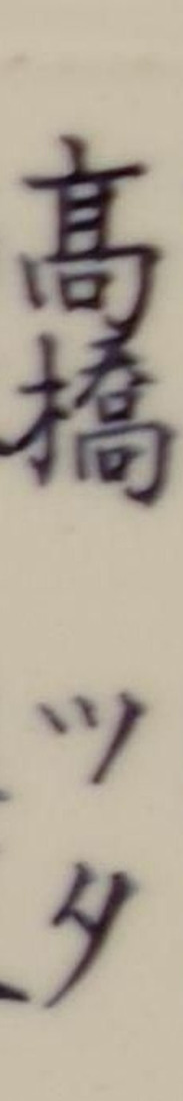高橋ツタ
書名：E~L
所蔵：高野山金剛峯寺
